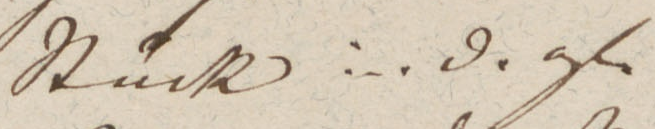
Stück u. d. gl.
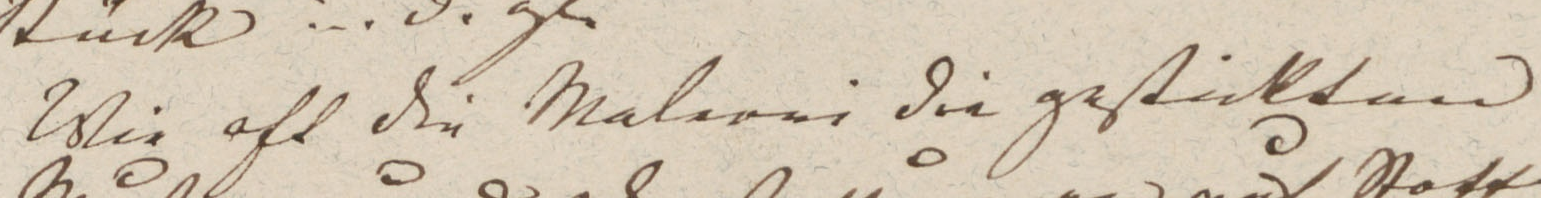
Wie oft die Malerei die gestickten
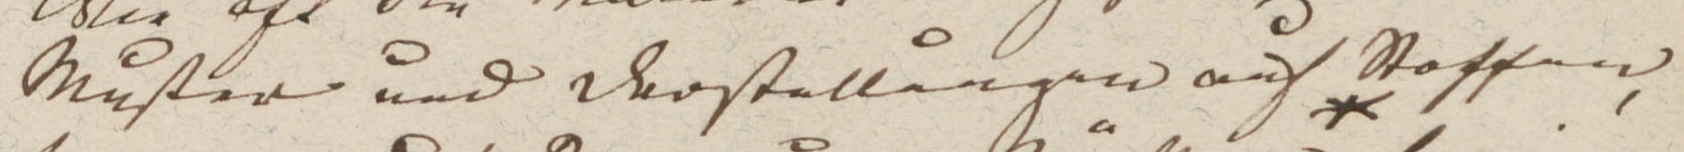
Muster und Darstellungen auf Stoffen,
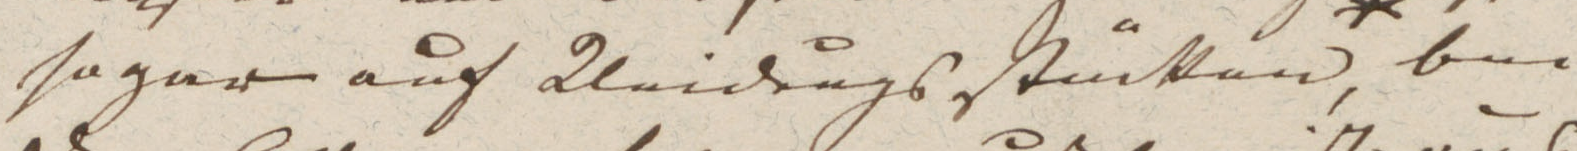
sogar auf Kleidungsstücken, % bei
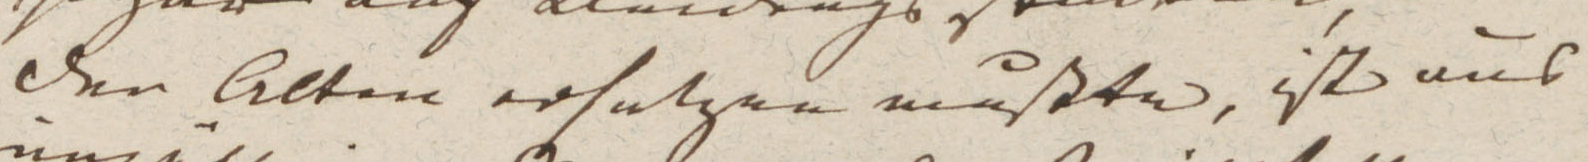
den Alten ersetzen musste, ist aus
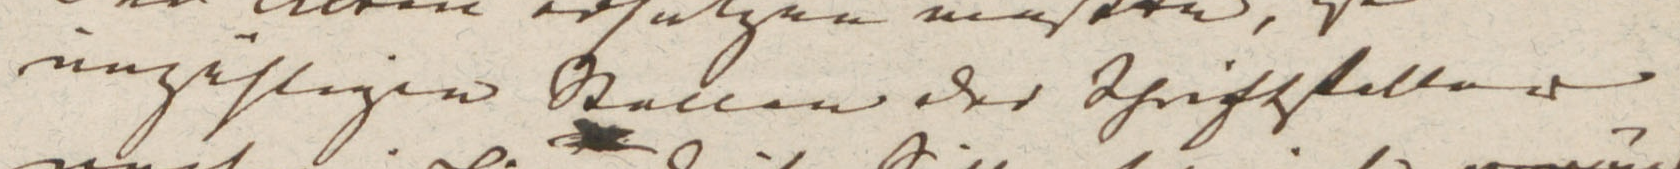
unzähligen Stellen der Schriftsteller
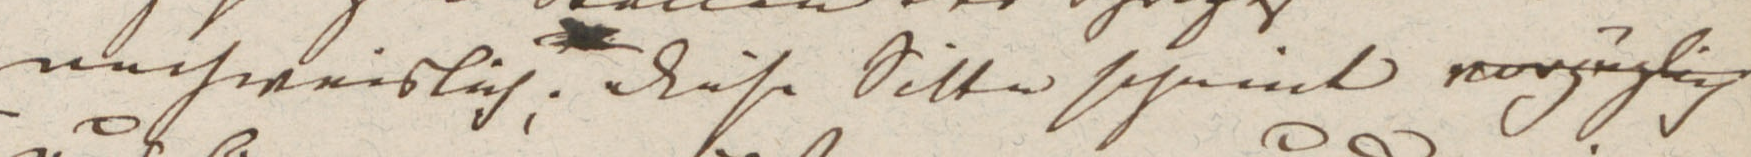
nachweislich; % Diese Sitte scheint vorzüglich
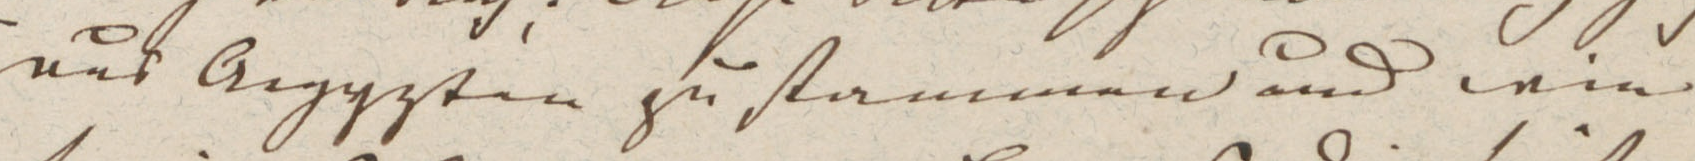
aus Aegypten zu stammen und wie
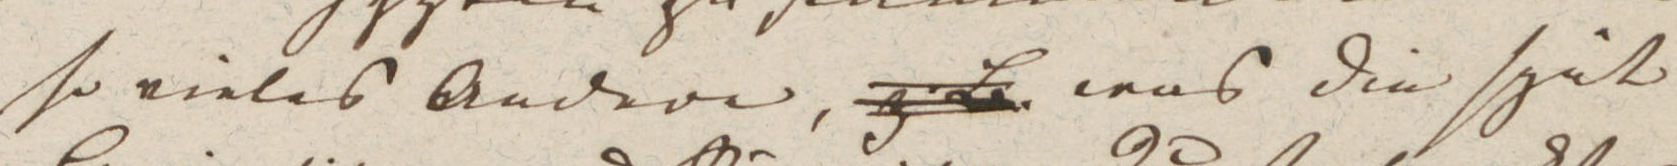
so vieles Andere, z.B. was die spät
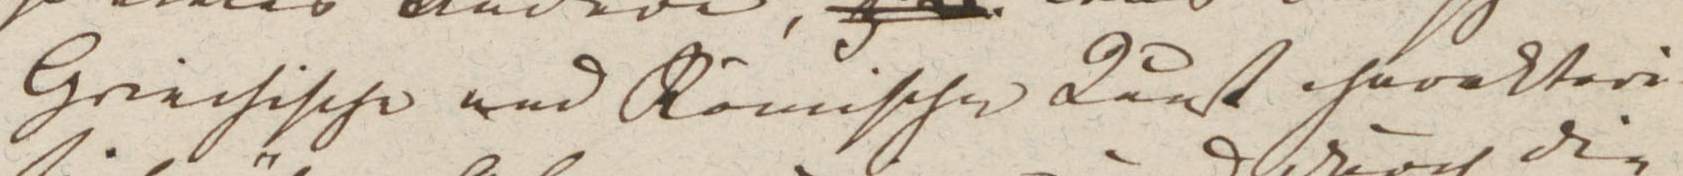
Griechische und Römische Kunst charakteri-
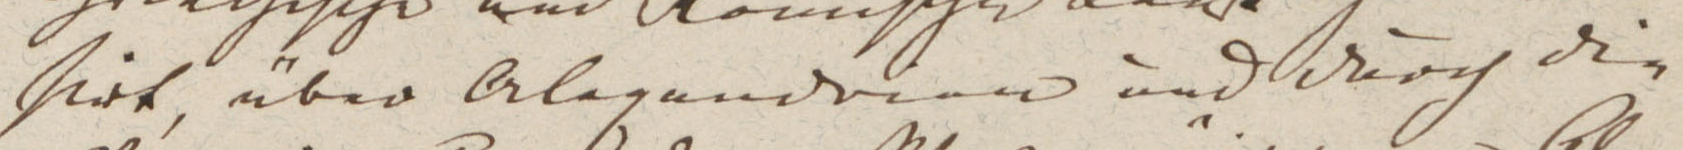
sirt, über Alexandrien und durch die
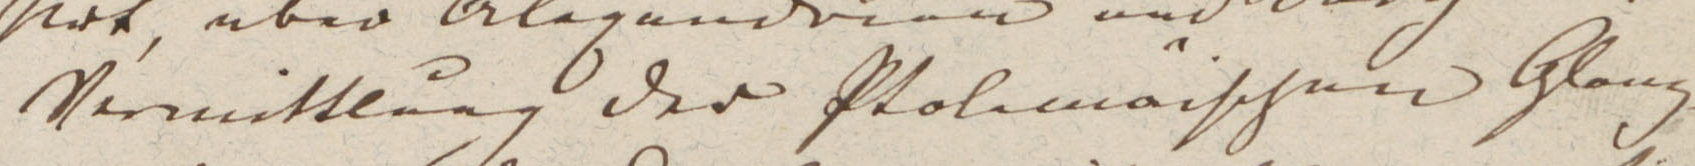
Vermittlung der Ptolemäischen Glanz-
